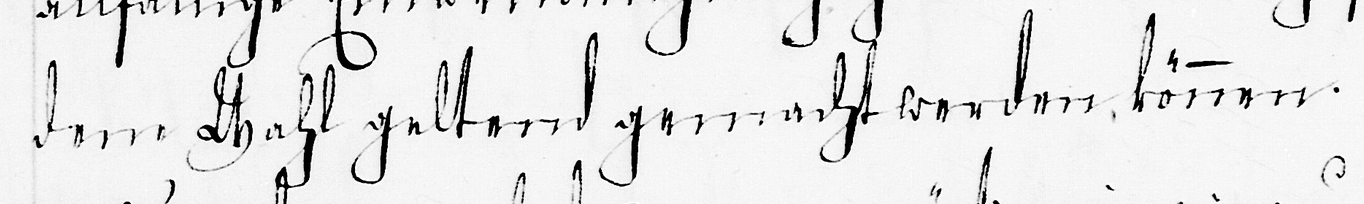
dene Wahl geltend gemacht werden können.
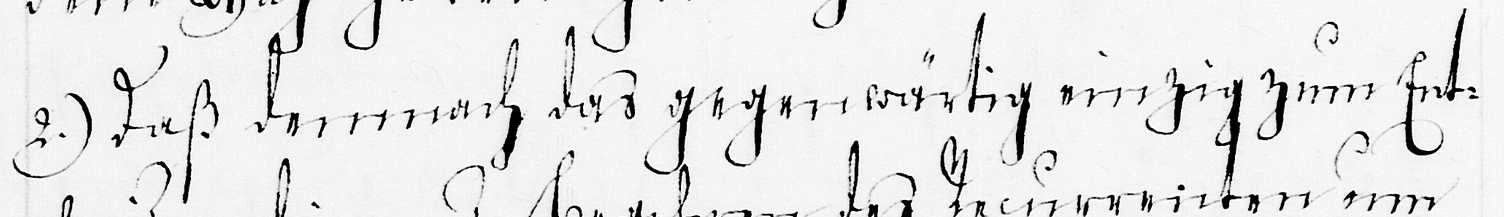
2.) Daß demnach das gegenwärtig einzig zum Ent¬
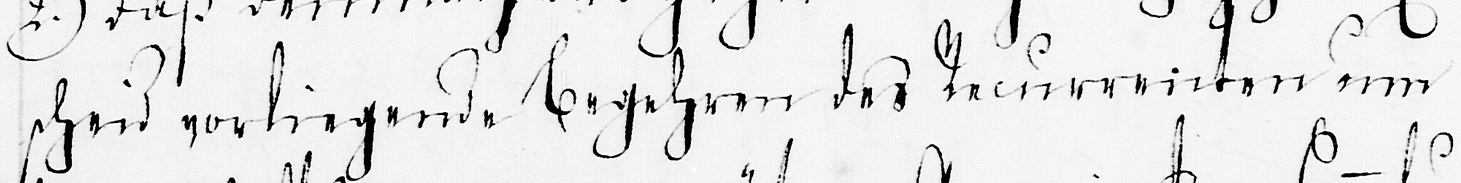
scheid vorliegende Begehren des Recurrenten um
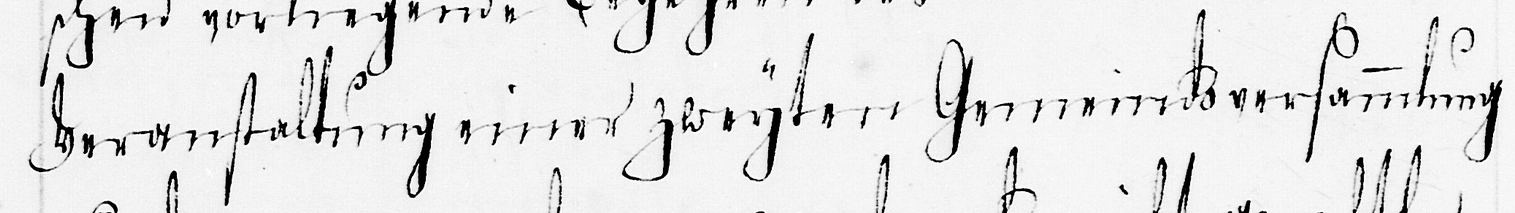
Veranstaltung einer zweyten Gemeindsversammlung
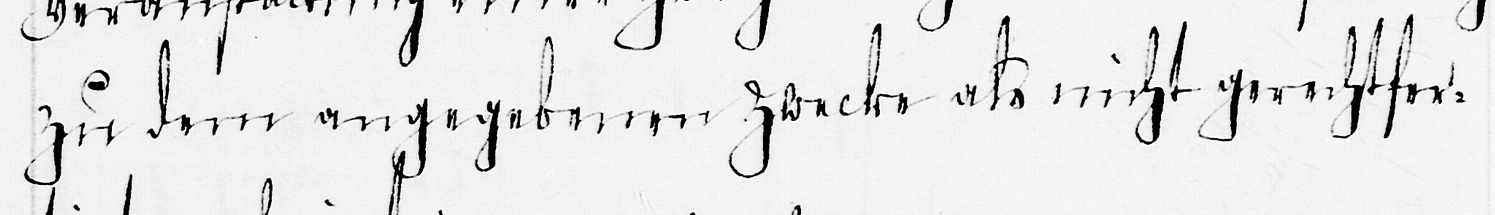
zu dem angegebenen Zwecke als nicht gerechtfer¬
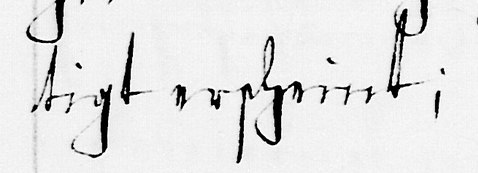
tigt erscheint;
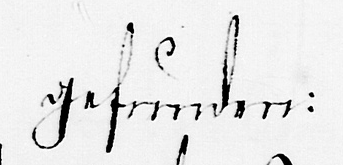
gefunden:
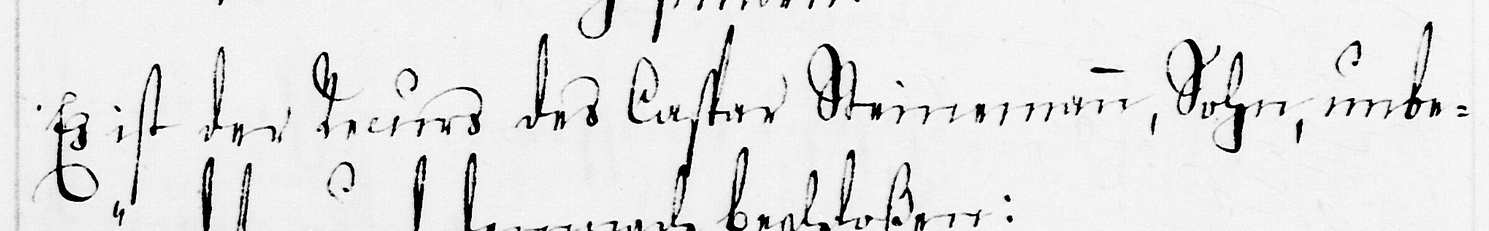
Es ist der Recurs des Caspar Steinemann, Sohn, unbe¬
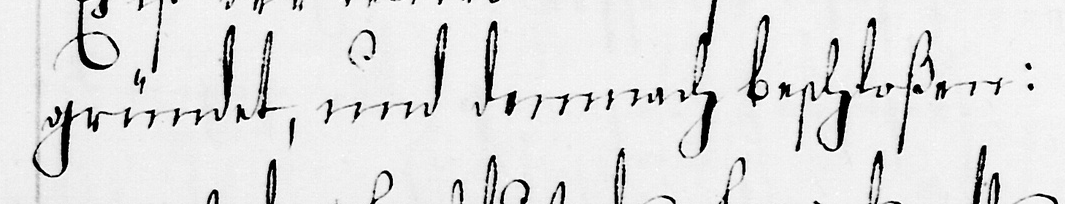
gründet, und demnach beschloßen:
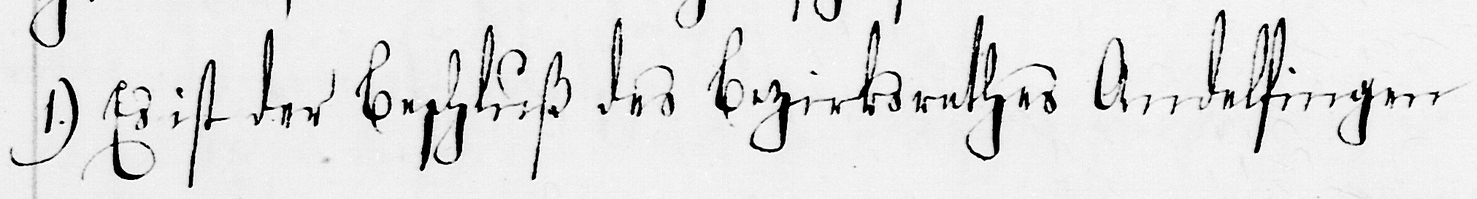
1.) Es ist der Beschluß des Bezirksrathes Andelfingen
